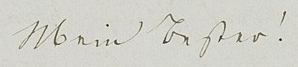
Mein Bester!
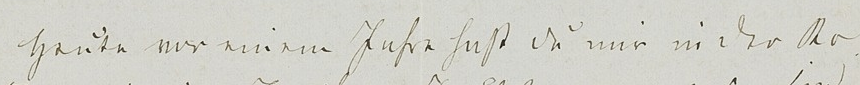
Heute vor einem Jahr hast du mir in der Ro-
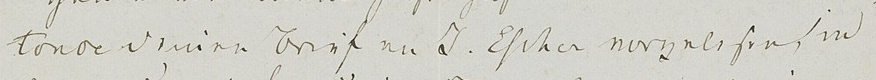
tonde deinen Brief an J. Escher vorgelesen, in
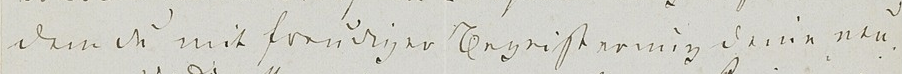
dem du mit freudiger Begeisterung deine neu-
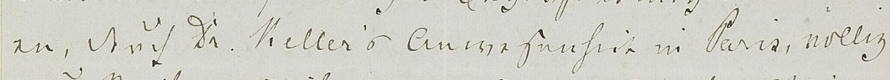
en, durch Dr. Keller's Anwesenheit in Paris, völlig
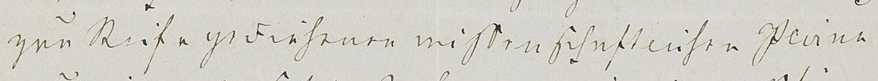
zur Reife gediehenen wissenschaftlichen Pläne
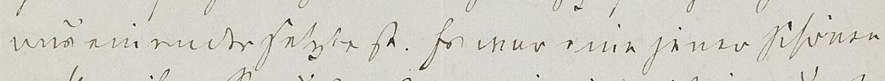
auseinandersetztest. Es war eine jener schönen
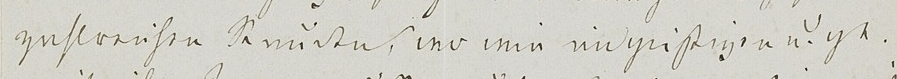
zahlreichen Stunden, wo wir im geistigen u. ge-
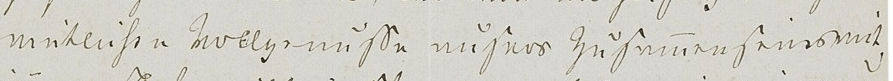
mütlichen Vollgenuße unsers Zusammenseins mit
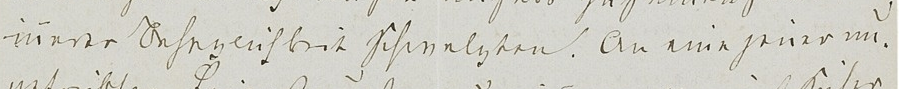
innerer Behaglichkeit schwelgten. An eine jener un-
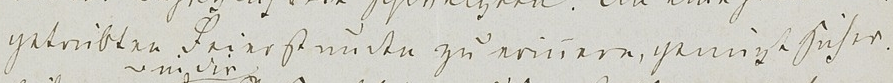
getrübten Feierstunden zu erinnern, genügt sicher-
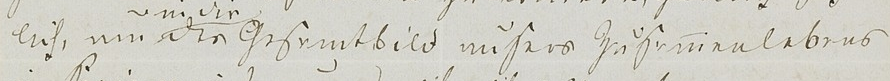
lich, um in dir das Gesamtbild unsers Zusammenlebens
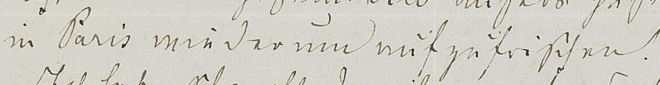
in Paris wiederum aufzufrischen!
